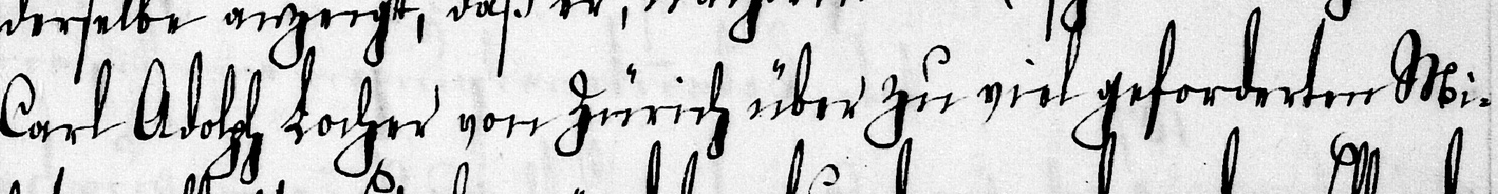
Carl Adolph Locher von Zürich über zu viel geforderten Mi¬
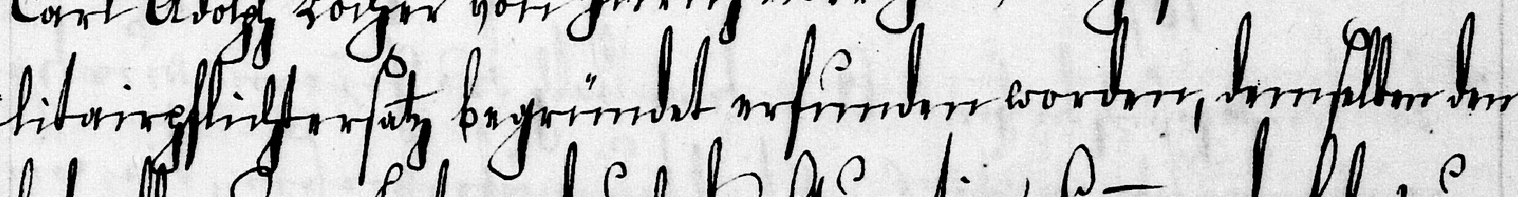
litairpflichtersatz begründet erfunden worden, demselben den
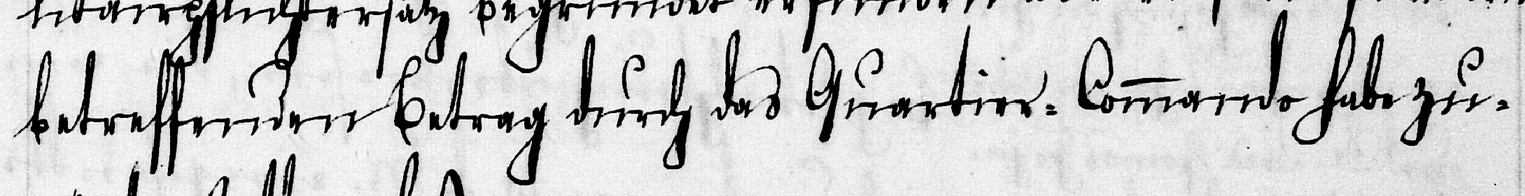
betreffenden Betrag durch das Quartier-Commando habe zu¬
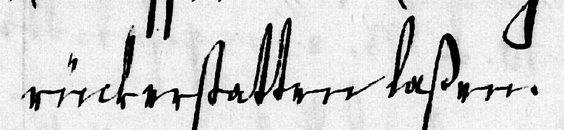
rückerstatten laßen.
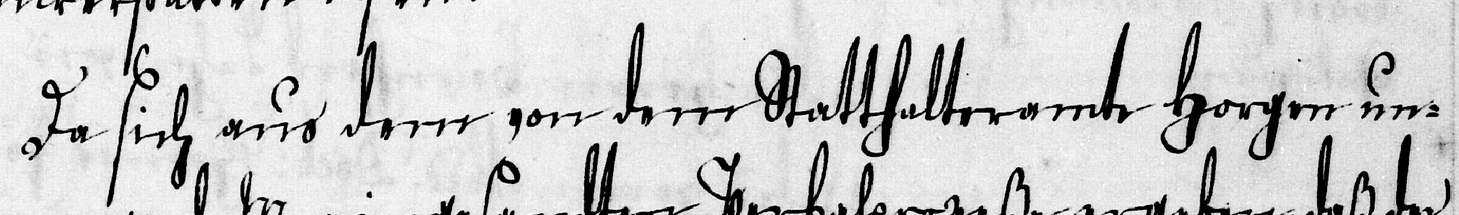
Da sich aus dem von dem Statthalteramte Horgen un¬
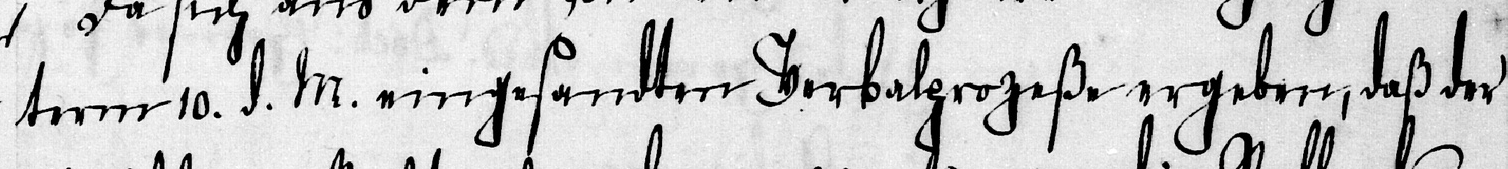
term 10. d. M. eingesandten Verbalprozeße ergeben, daß der
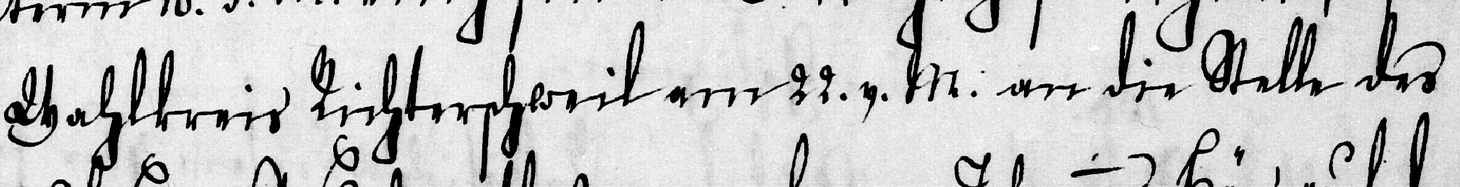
Wahlkreis Richterschweil am 22. v. M. an die Stelle des
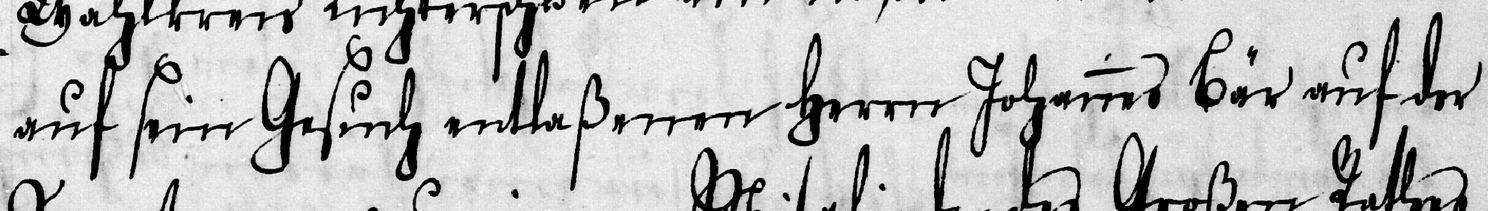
auf sein Gesuch entlaßenen Herrn Johannes Bär auf der
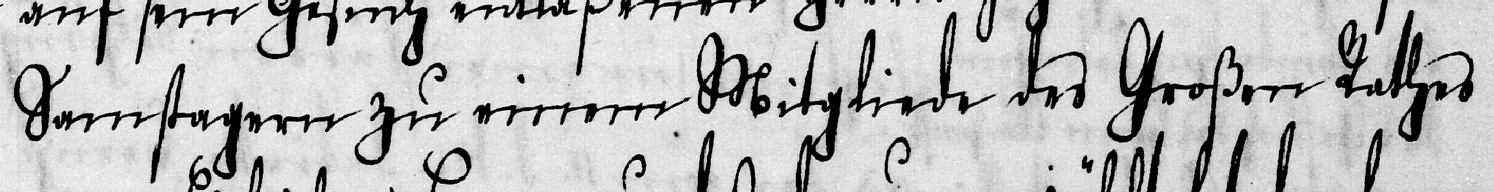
Samstagern zu einem Mitgliede des Großen Rathes
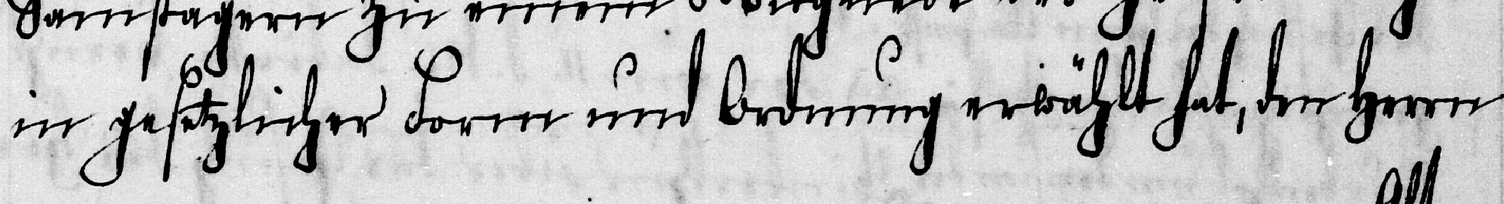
in gesetzlicher Form und Ordnung erwählt hat, den Herrn
